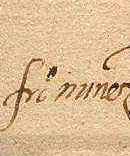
frco nunez
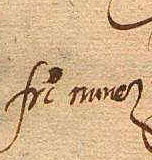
frco nunez
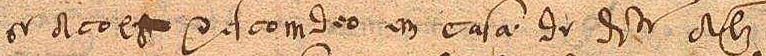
se Acolh_ e escomdeo em casa do dito Al̄z
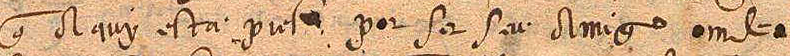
q̄ Aquy esta pres_ por ser seu Amigo omde o
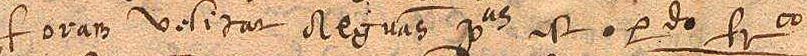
foram vesitar Alguās pas .s. o Ldo frco
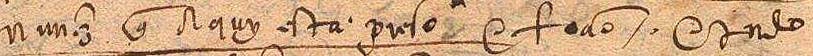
nunēz q̄ Aquy esta preso e foaõ /. e tendo
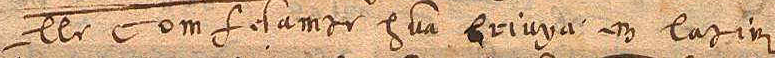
elle comfesamte hūa briuya em latim
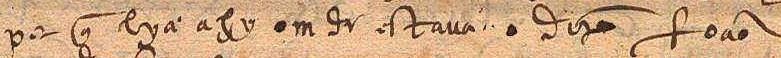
per q̄ lya ahy omde estaua o dit̄o foaõ
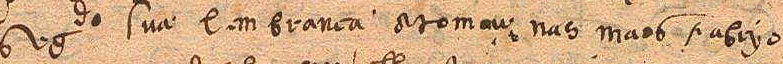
segdo sua lembranca A tomou nas maõs e abryo
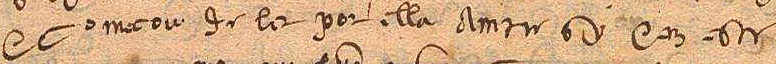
e começou de ler por ella Amtre sy e em este
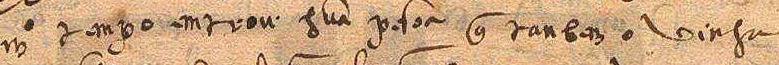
mo tempo emtrou hūa pesoa q̄ tambem o vinha
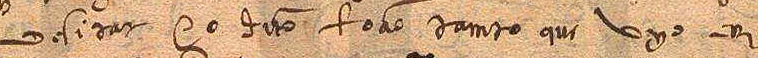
vesitar e o dit̄o foão tamto que vyo em
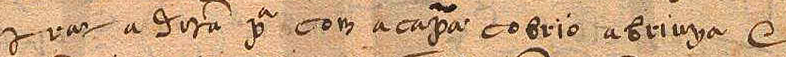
trar a ditā pa com a capa cobrio a briuya e
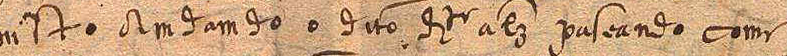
nisto Amdamdo o ditō drte al̄z paseando come
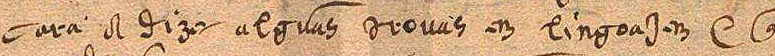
çara A dizer algūas trouas em lingoajem e q̄
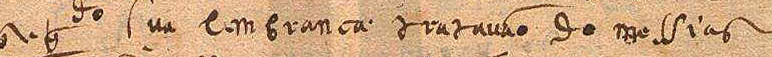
segdo sua lembrança tratauão do messias
